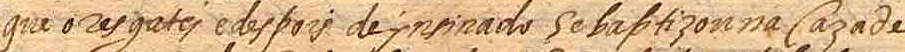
que o resgatej e despois de ynsinado se baptizou na Caza de
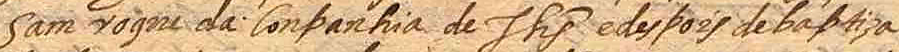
Sam roque da Conpanhia de Jhs̄ e despois de baptiza
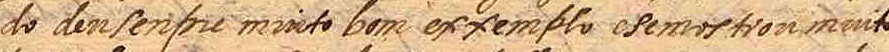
do deu senpre muito bom exxemplo e se mostrou muito
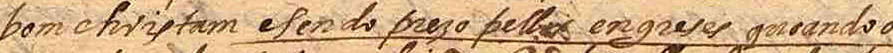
bom christam e sendo prezo pellos engreses quoando o
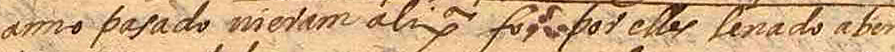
anno pasado uieram a lixa foi por elles leuado a ber
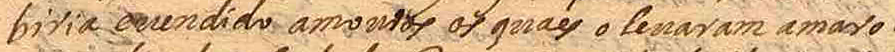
biria e uendido a mouros os quaes o leuaram a maro
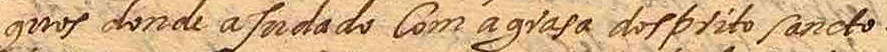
quos donde aJudado Com a grasa do sprito sancto.
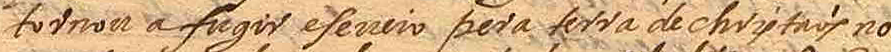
tornou a fugir e se ueio pera terra de christaõs no
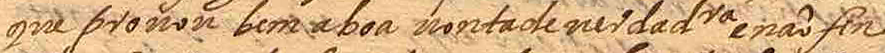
que prouou bem a boa uontade uerdadra e naõ fin
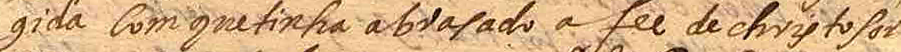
gida Com que tinha abrasado a fee de christo sor̄
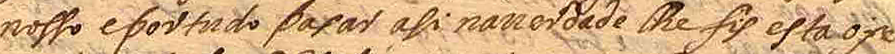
nosso e por tudo pasar asi na uerdade lhe fis esta oye
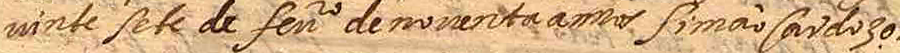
uinte sete de feuro de nouenta annos Simaõ Cardozo.
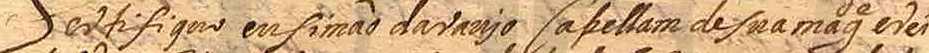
Sertifiquo eu simão daraujo Capellam de sua magde e rei
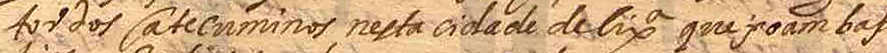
tor dos Catecuminos nesta cidade de lixa que yoam bap
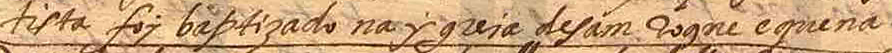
tista foy baptizado na ygreia de sam Roque e que na
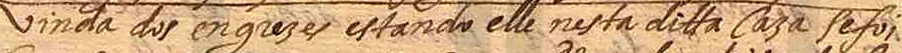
Vinda dos engrezes estando elle nesta ditta Caza se foi
